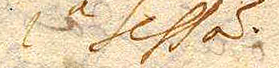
1a sessaõ.
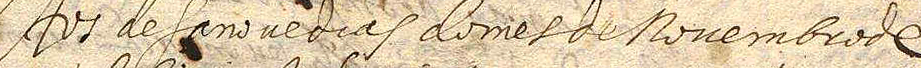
Aos desanoue dias do mes de Nouembro de
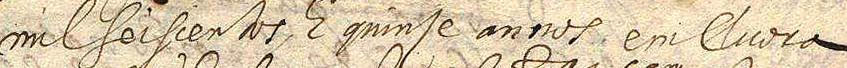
mil seisçentos, E quinze annos em Euora
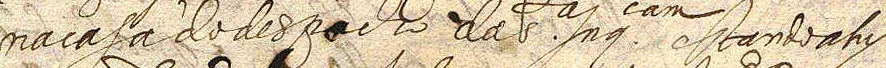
na casa do despacho da sta. Jnq.cam estando ahy
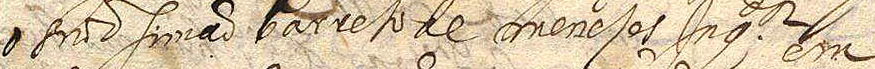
o snor̄ simaõ barreto de meneses Jnq.dor em
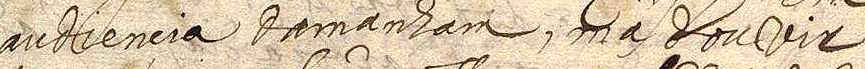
audiençia da manham, mādou vir
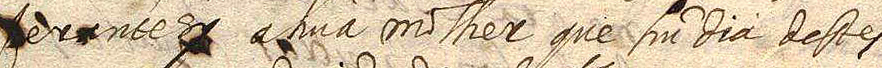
perante sy a huā molher que hū dia destes
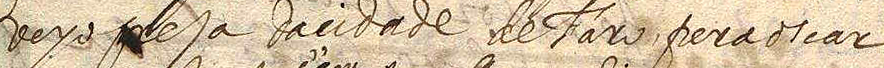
veyo presa da çidade de Faro, pera os car
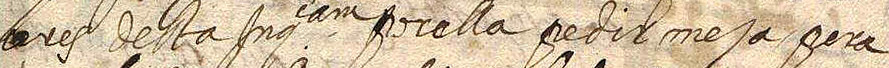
çeres desta Jnq.cam por ella pedir mesa pera
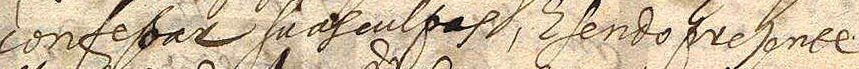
confessar suas culpas, E sendo presente
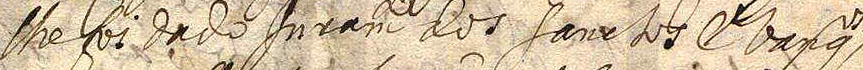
lhe foi dado Juramto dos sanctos &Vangos.,
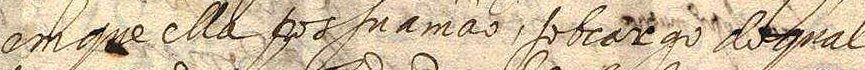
em que ella pos sua mão, sob cargo do qual
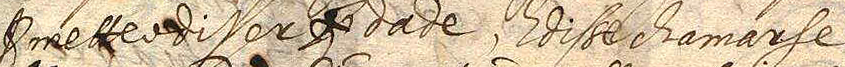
ꝓmetteo dizer ꝟdade, E disse chamarse
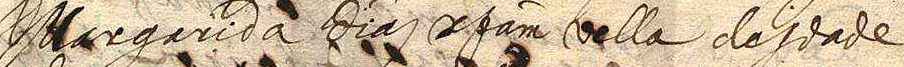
Margarida dīaz xpam̄ vella de jdade
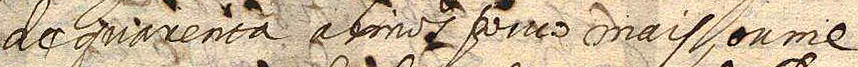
de quarenta annos pouco mais, ou me
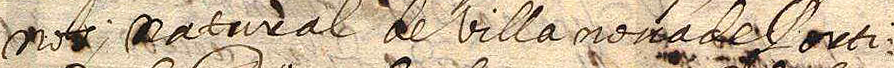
nos; natural de villa noua de Porti
